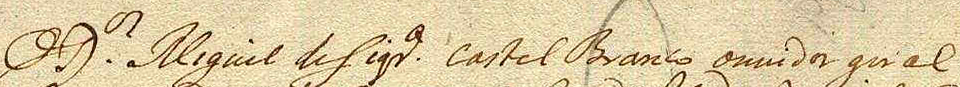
O D.or Miguel de Siqr.a castel Branco ouuidor geral
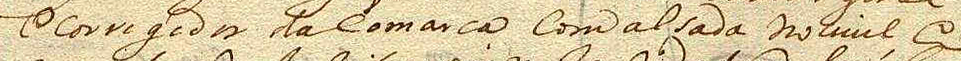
O corregedor da Comarca Com alsada no ciuel e
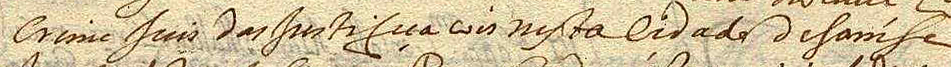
crime Juis das Justificaçois nesta cidade de sam se
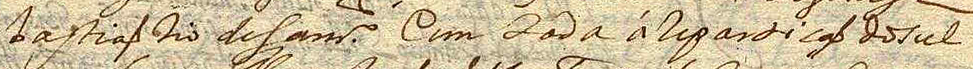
bastiaõ Rio de Janr.o E em toda á Repartiçaõ do sul
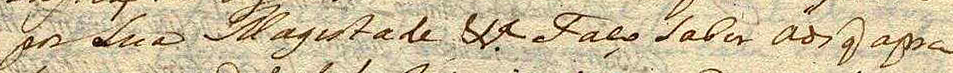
por sua Magestade &.a Faço saber aos q̄ a pre
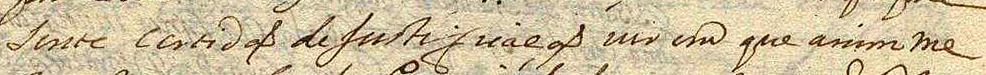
sente certidaõ de Justificaçaõ uirem que asim me
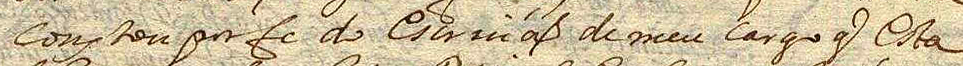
constou por fe do Escriuaõ de meu Cargo q̄ Esta
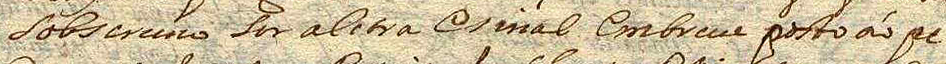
sobscreueo ser a letra e sinal em breue posto ao pe
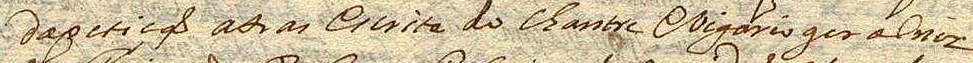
da petiçaõ atras escrita do chantre e vigario geral nez
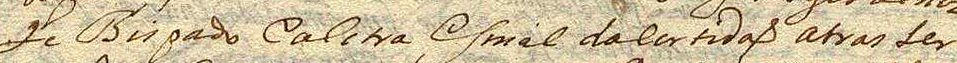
te Bispado e a letra e sinal da certidaõ atras ser
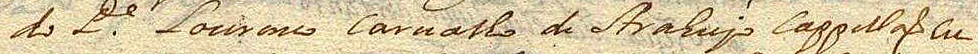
do P.e Lourenço carualho de Arahujo Cappellaõ cu
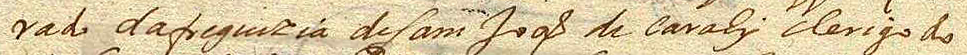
rado da freguezia de sam Joaõ de carahy clerigo do
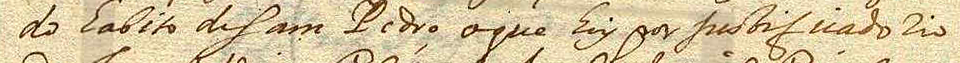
do habito de sam Pedro o que hey por Justificado Rio
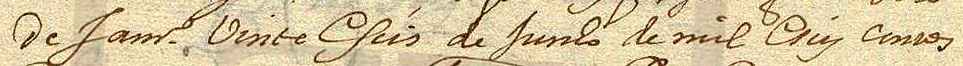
de Janr.o Vinte E seis de Junho de mil e seiscentos
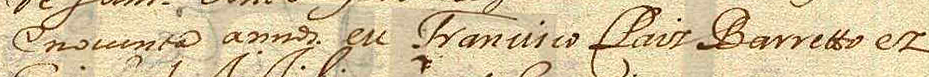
e nouenta annos. eu Francisco Paiz Barretto ez
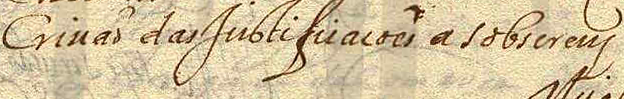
Criuaõ das Justificaçoẽs a sobscreuj
